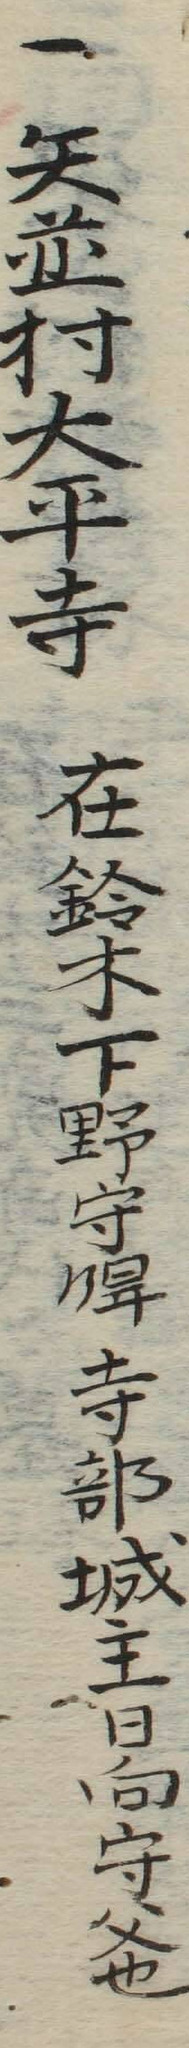一矢並村大平寺在鈴木下野守牌寺部城主日向守父也

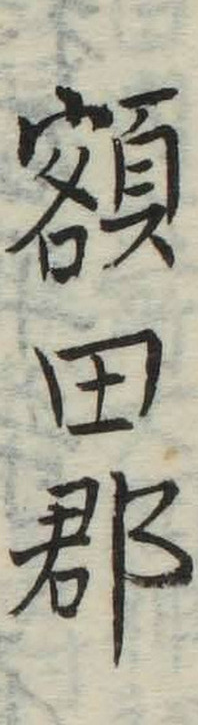額田郡
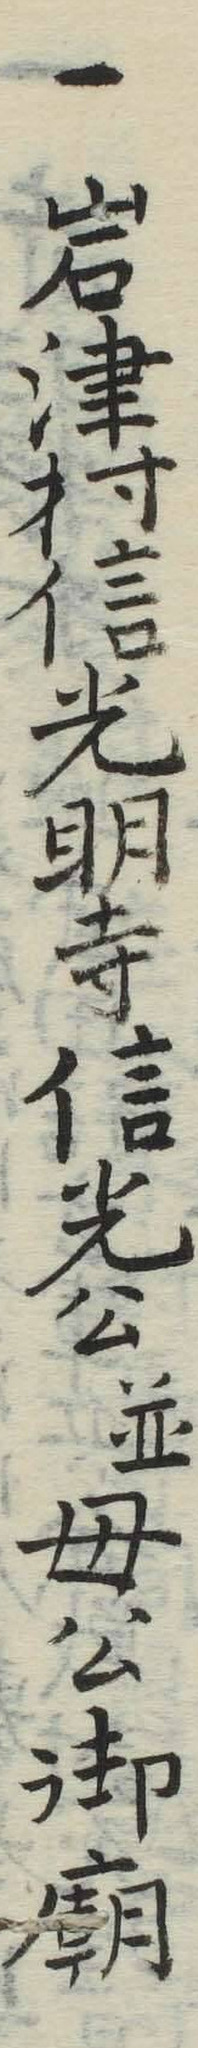一岩津村信光明寺信光公並母公御廟
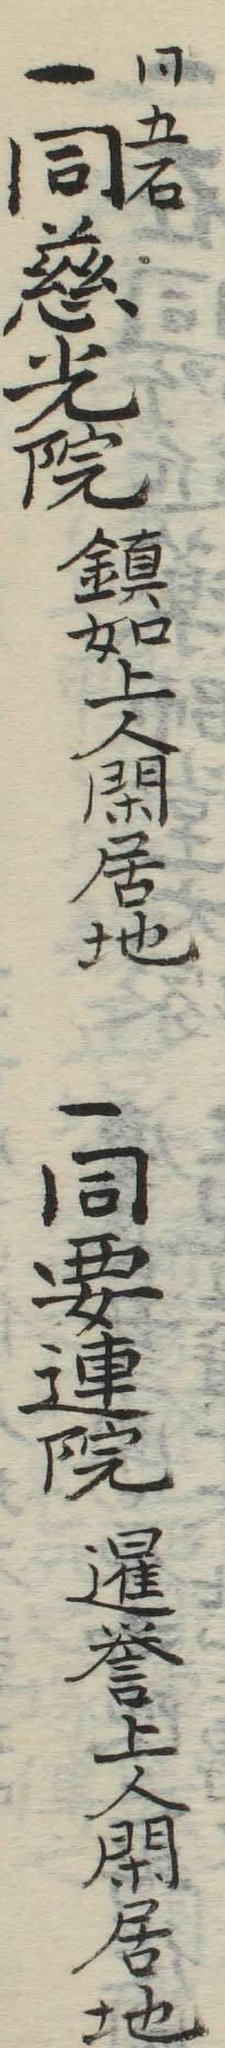一同慈光院鎮如上人閑居地一同要連院暹誉上人閑居地

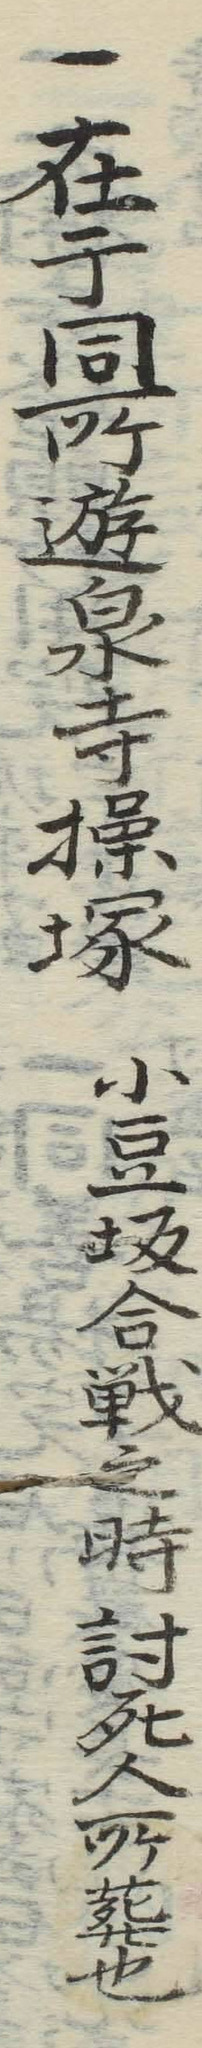一在于同所遊泉寺操塚小豆坂合戦之時討死人所葬也
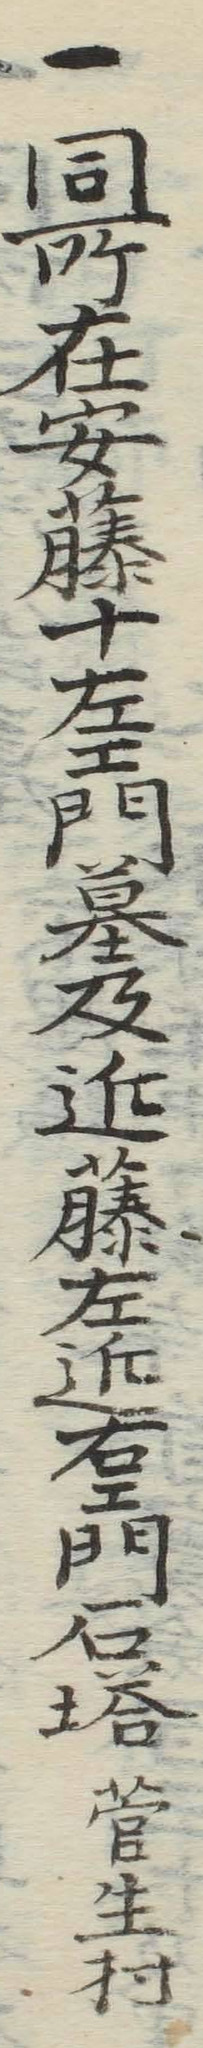一同所在安藤十左エ門墓及近藤左近右エ門石塔菅生村
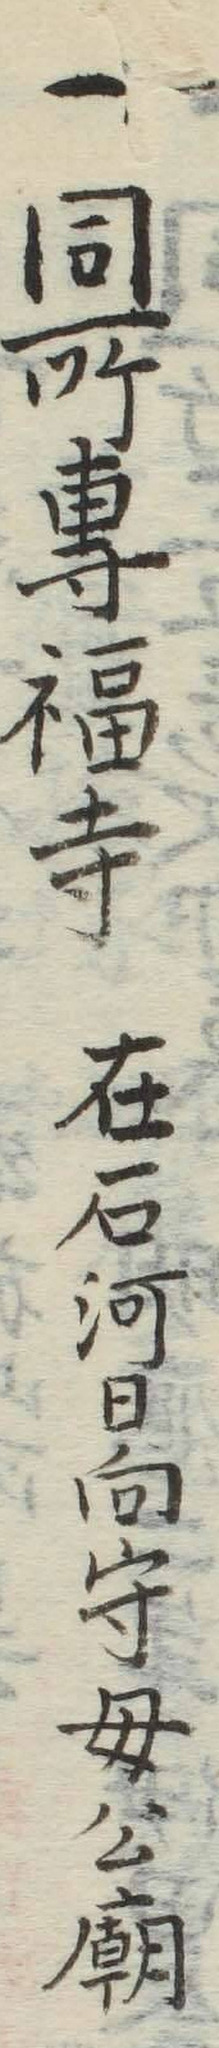一同所専福寺在石河日向守母公廟
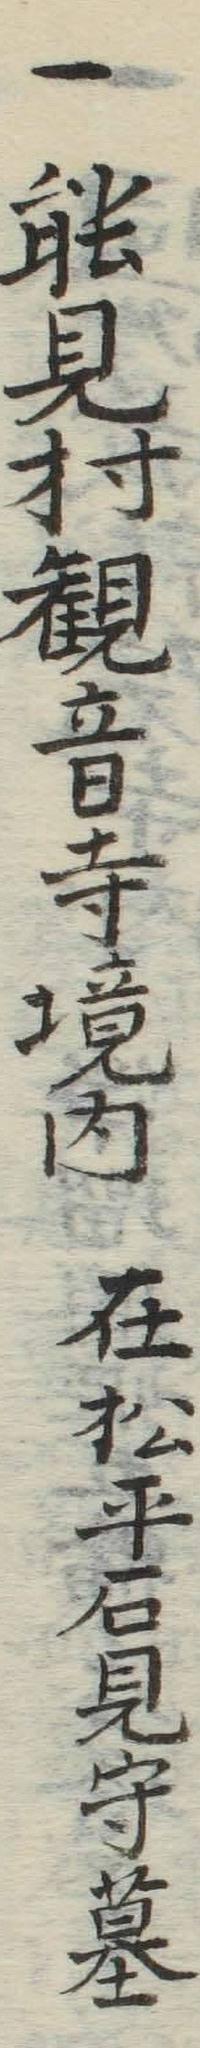一能見村観音寺境内在松平石見守墓
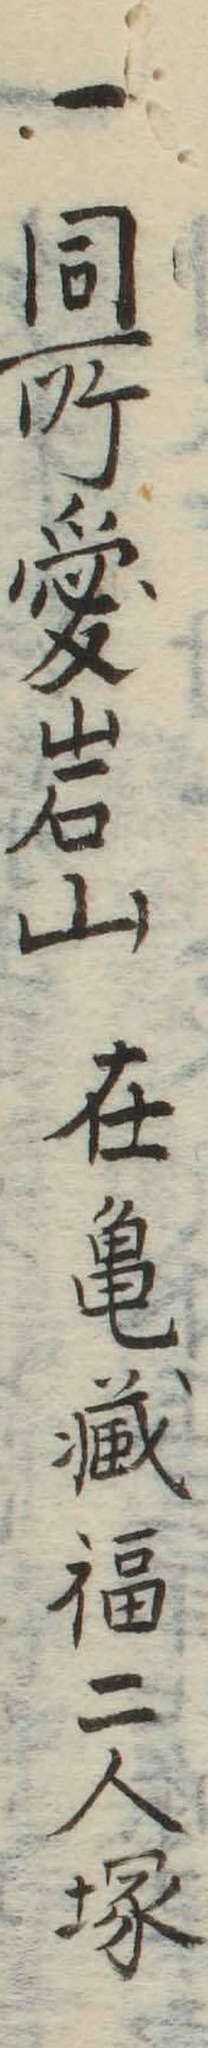一同所愛岩山在亀蔵福二人塚

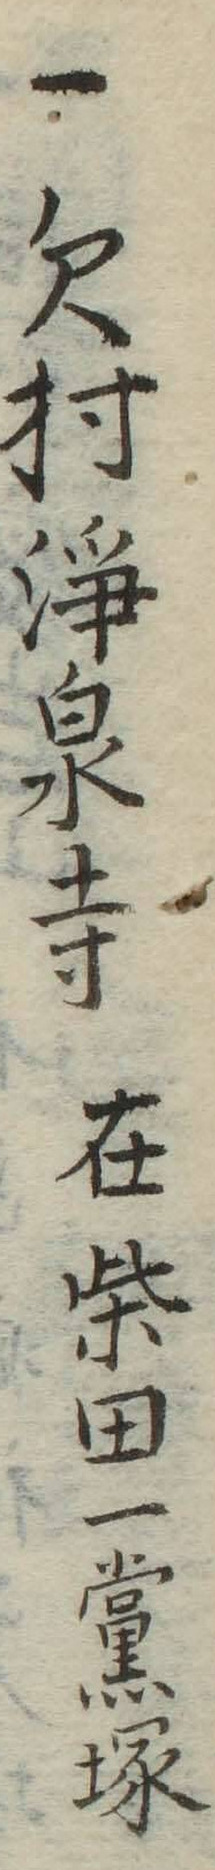一欠村浄泉寺在柴田一党塚
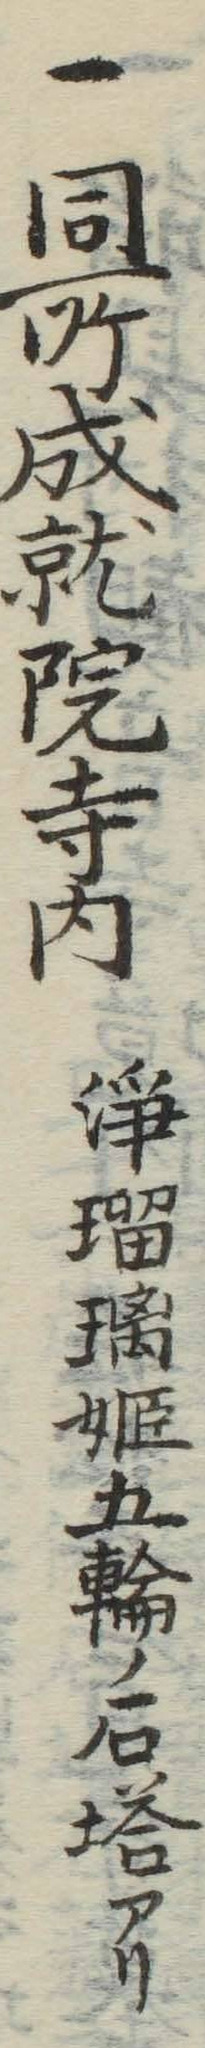一同所成就院寺内浄瑠璃姫五輪ノ石塔アリ
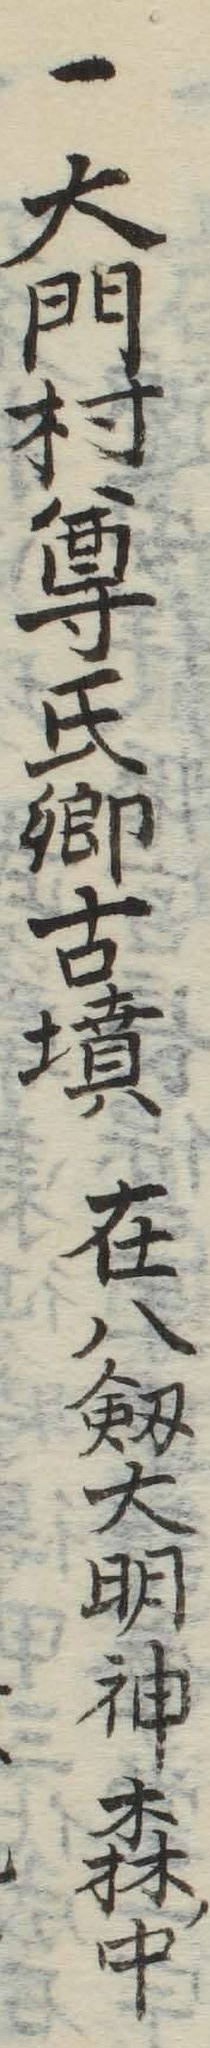一大門村尊氏卿古墳在八剣大明神森中

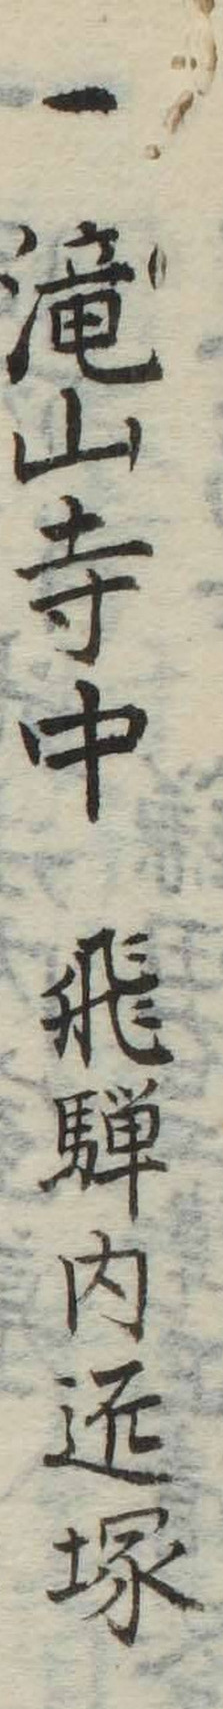一滝山寺中飛騨内塚
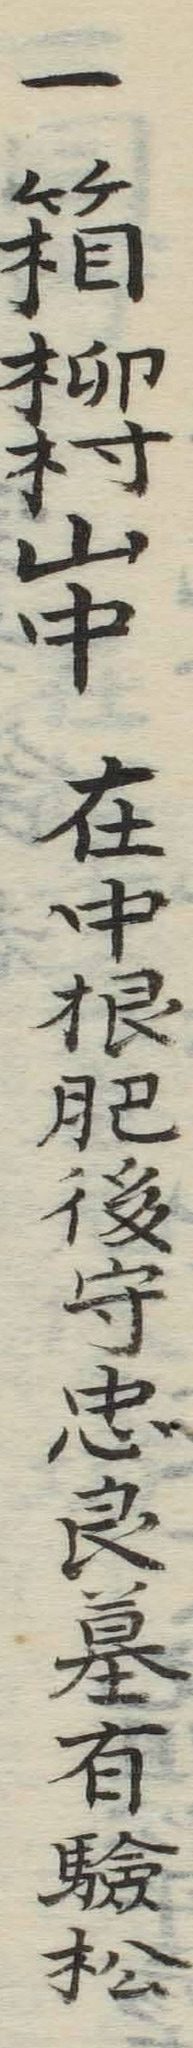一箱柳村山中在中根肥後守忠良墓有験松

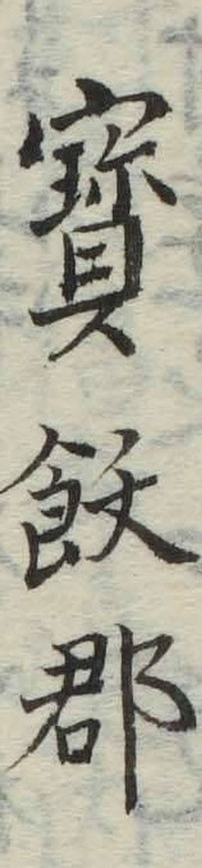宝飫郡
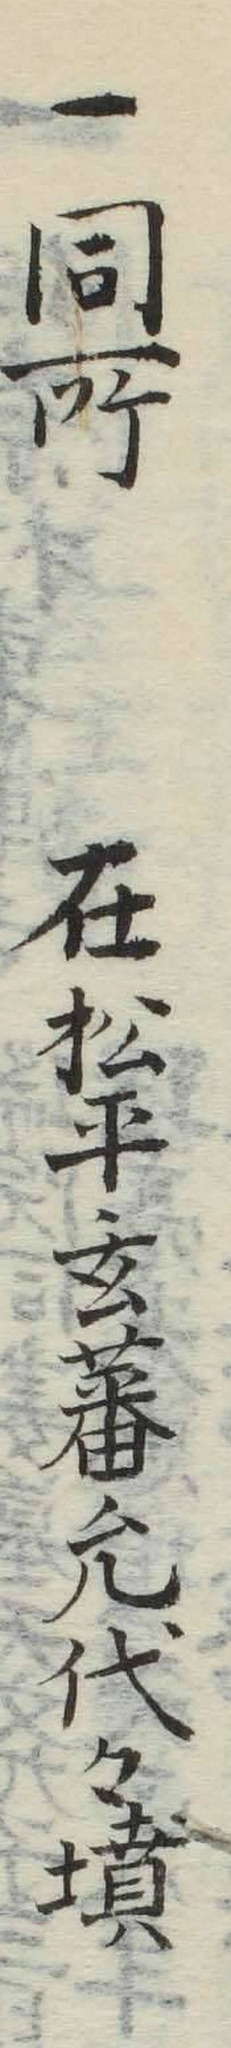一同所在松平玄蕃允代々墳
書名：三河国二葉松
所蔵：国文学研究資料館
